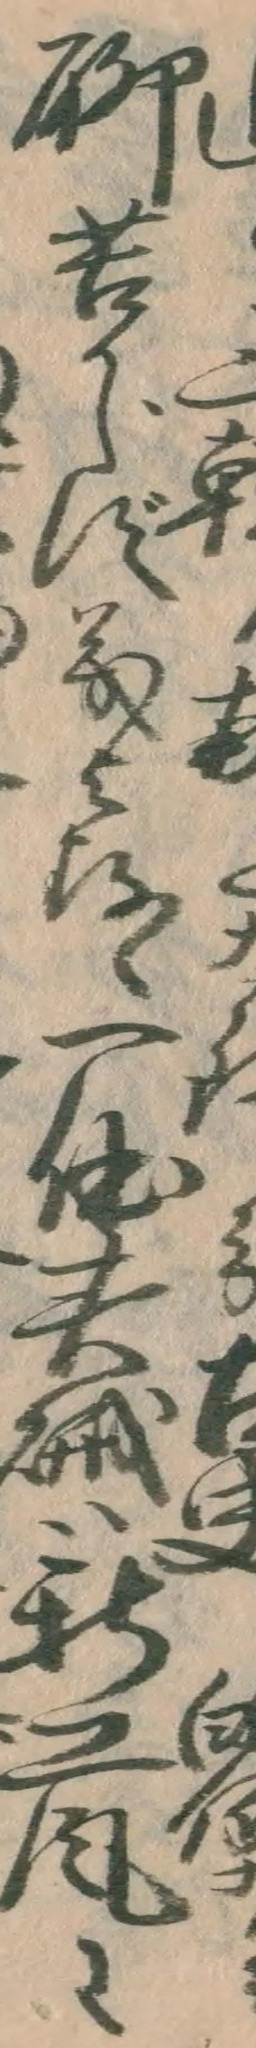聊苦からず義と存候一体夷賊ハ新工夫に
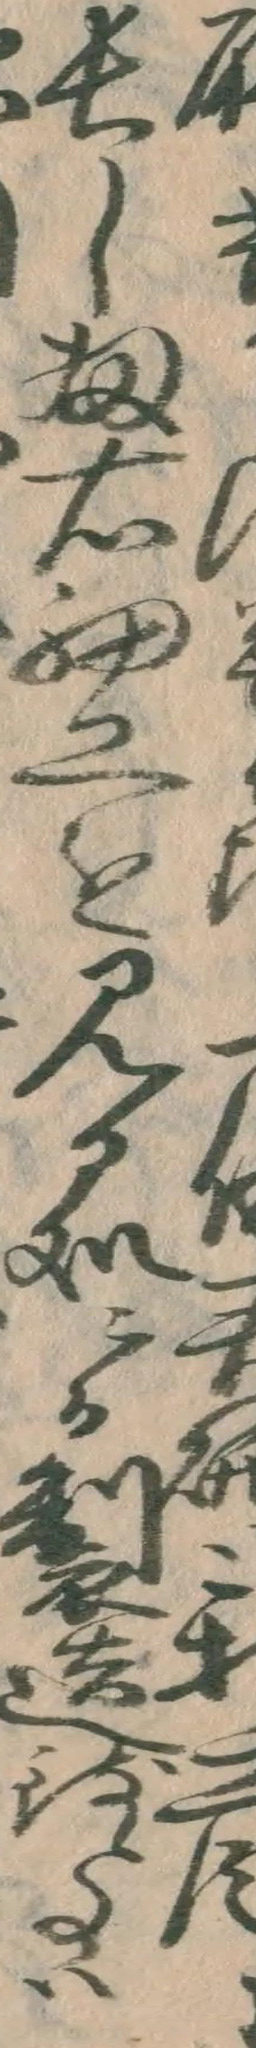長し扠右細工を見る処ニ而製造致候事ハ
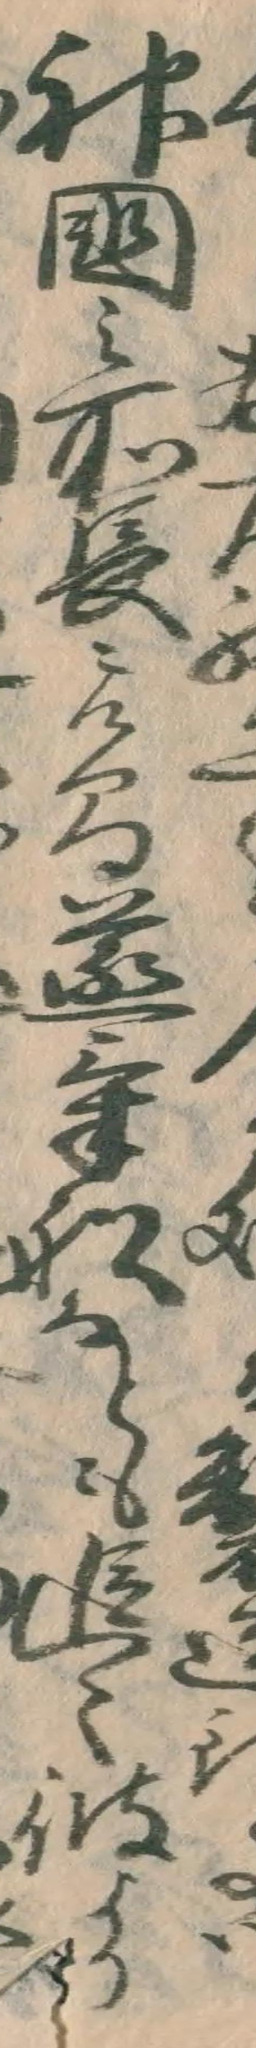神国之所長ニ候間蒸気船なとも追々彼より
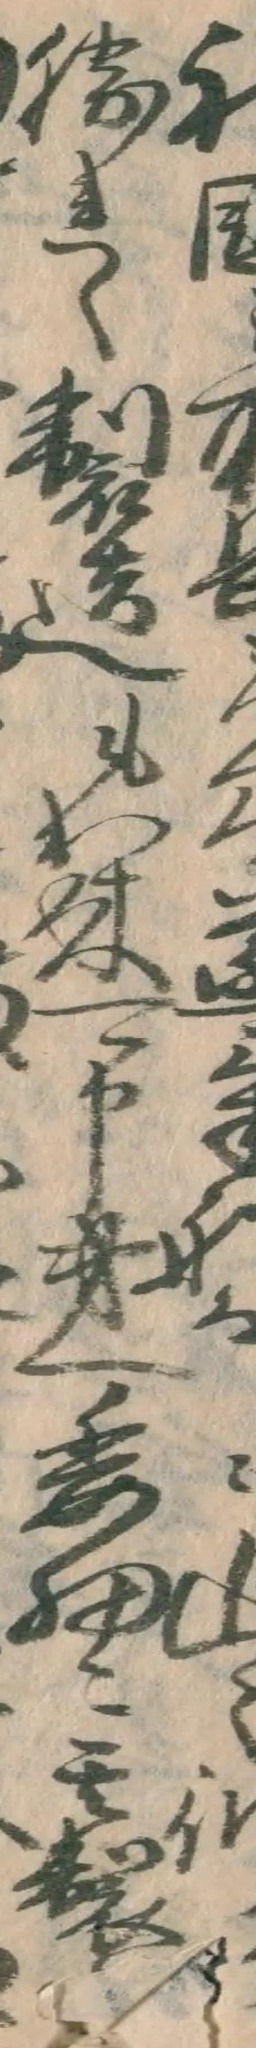勝れし製造も出来可申第一委細ニ其製
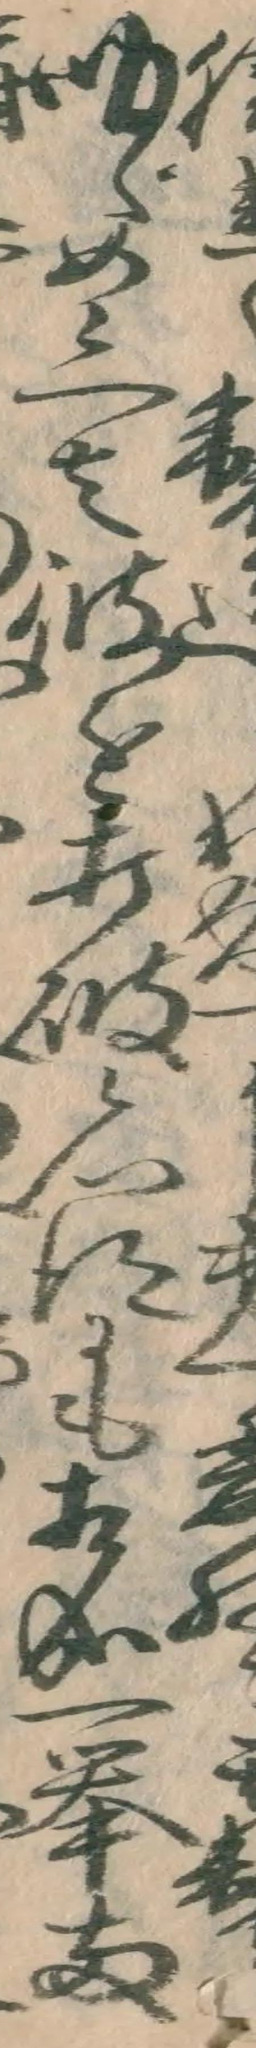明らめ候へ者彼を打破候心得にも相成一挙両
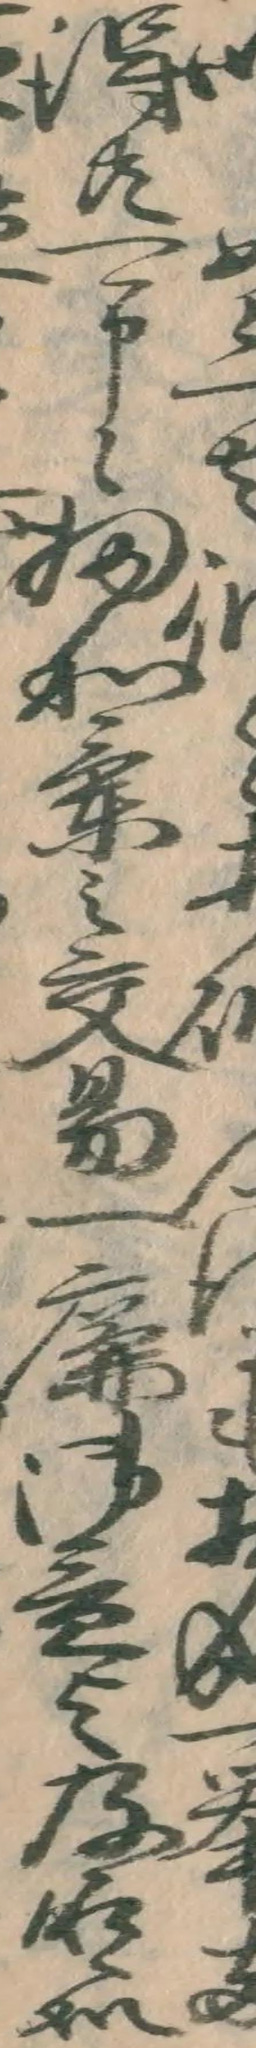得共可申候扠和蘭之交易一廉御益と及承候処
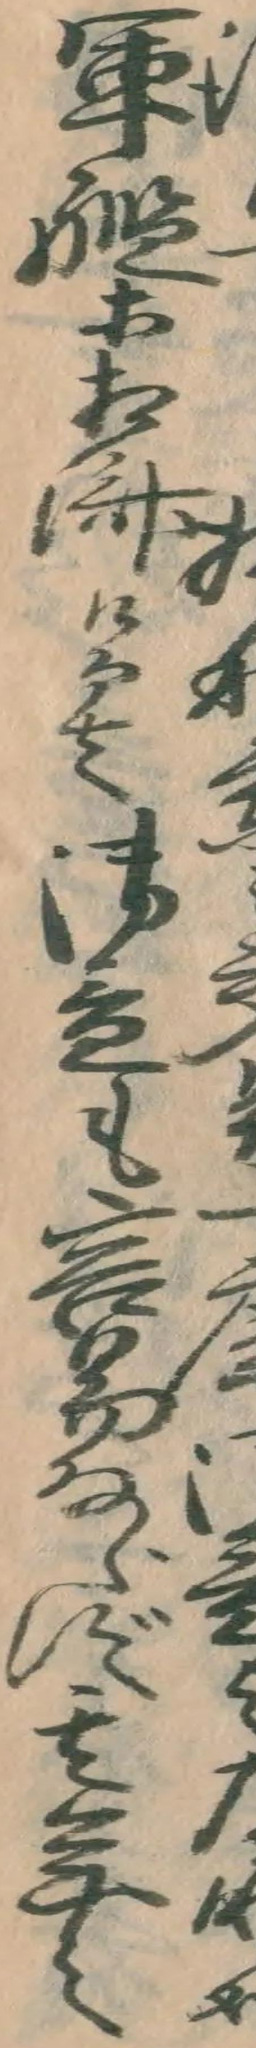軍艦等相済候而者御益も容易ならず其年々

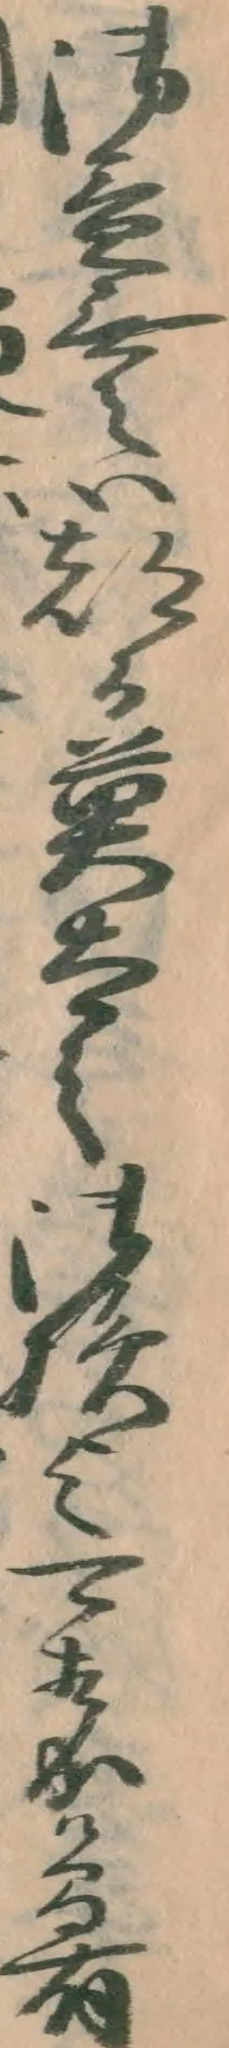御益無之都而莫太之御損と相成候間有
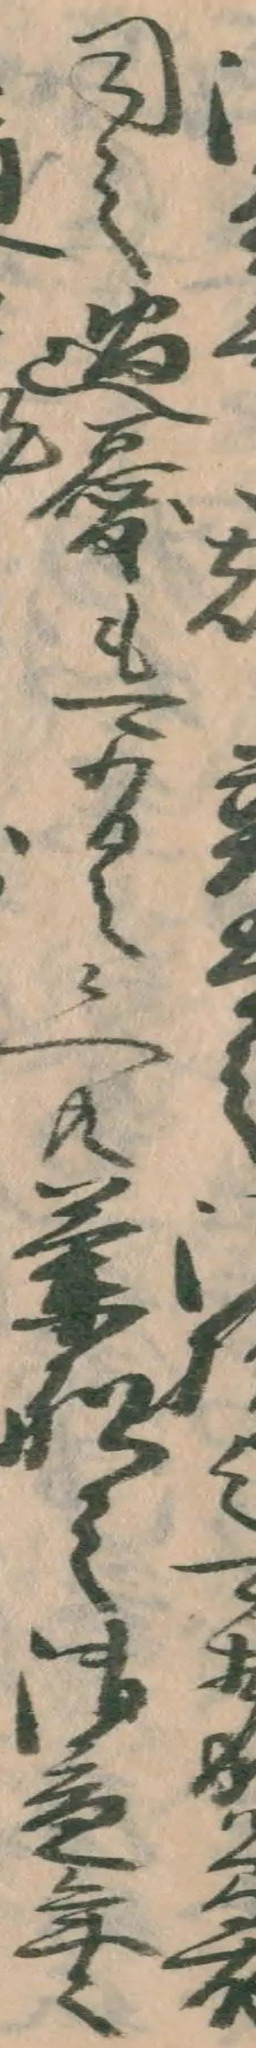司之過憂も可有之候へ共蘭船之御益年々
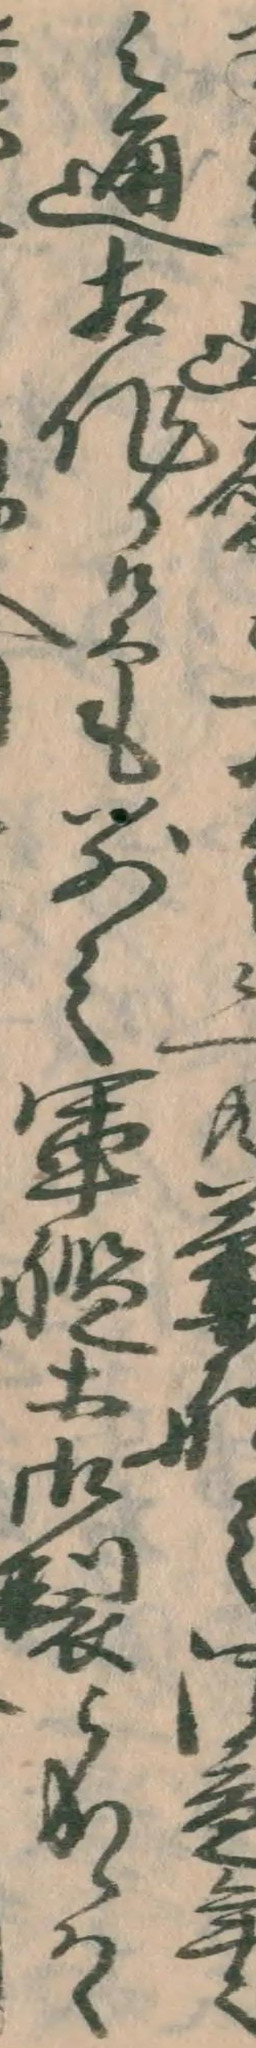之通相作り候而も別之軍艦等相製被成候ハヽ
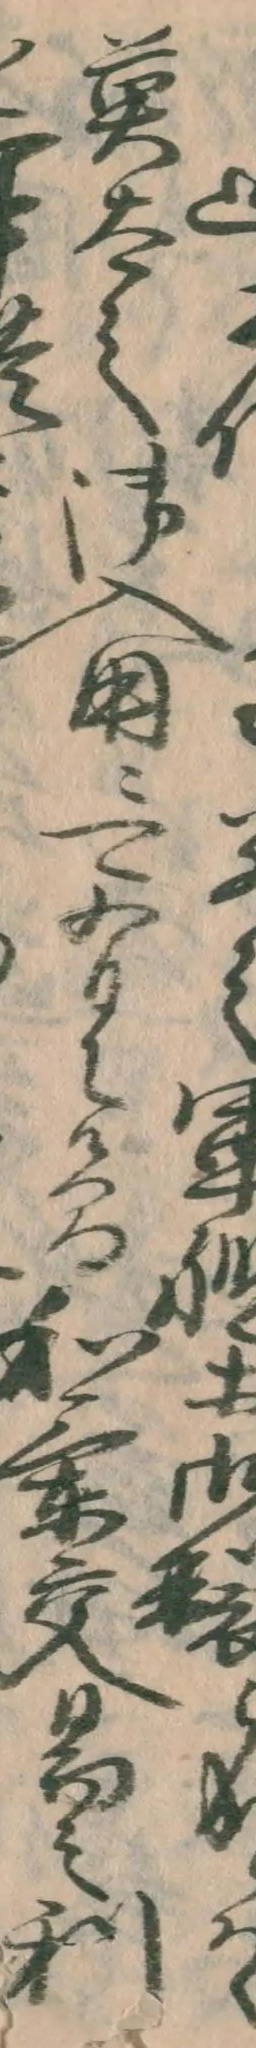莫太之御入用ニ可有之候間和蘭交易之利
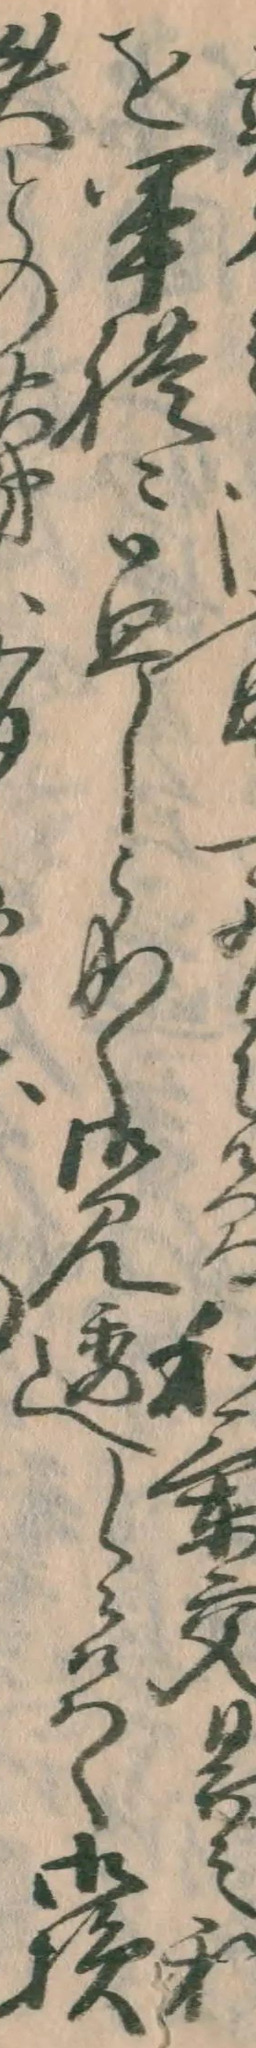を軍ニ御廻し被成候御見透しニ候ハヽ御損
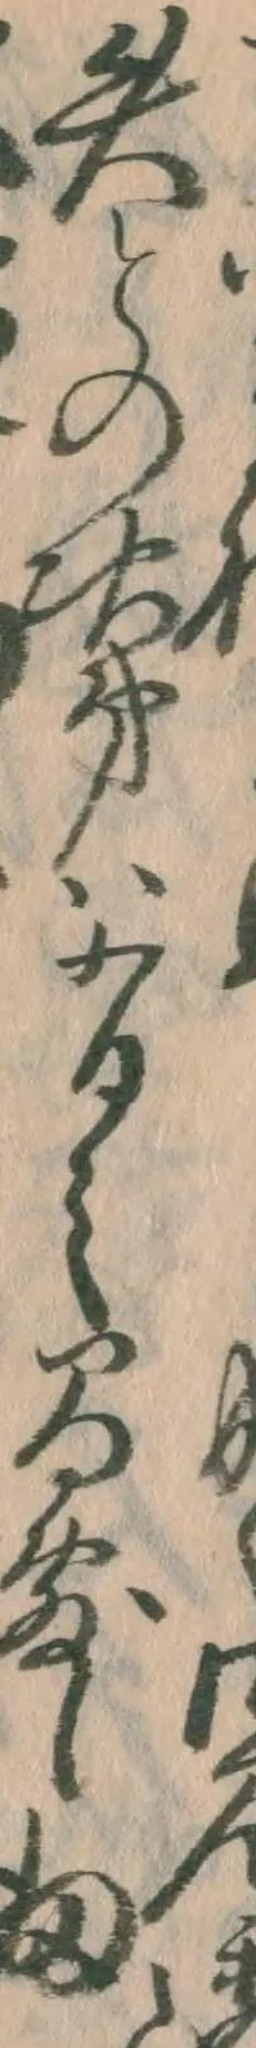失との次第ハ有之間敷候扠
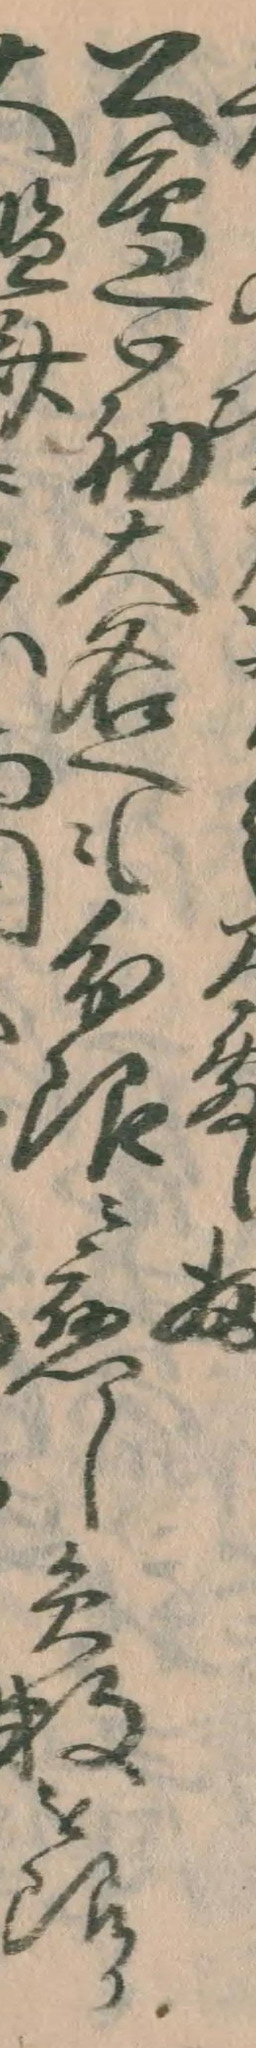公邊御初大名へも分限ニ應し員数を限り
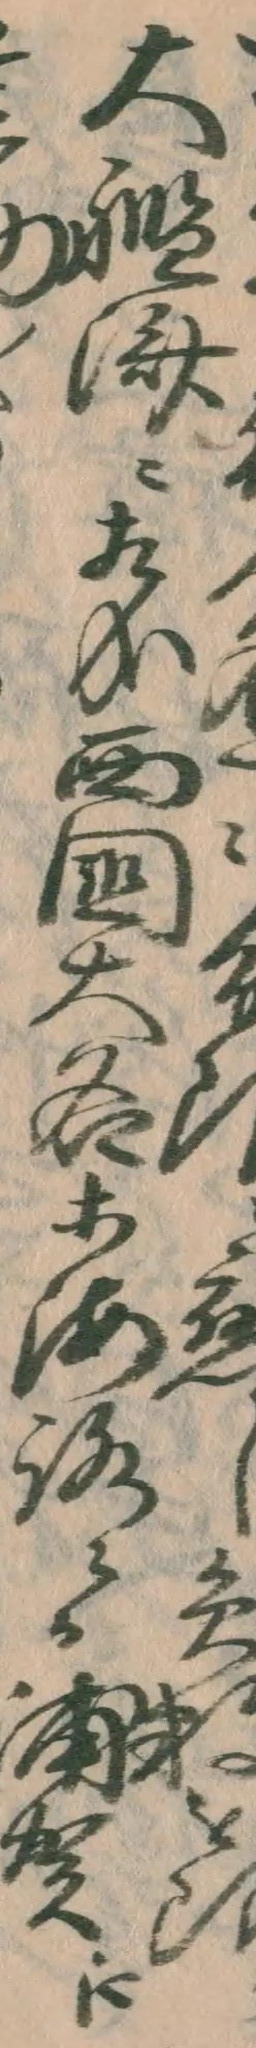大艦済ニ相成西国大名等海路ニ而浦賀江
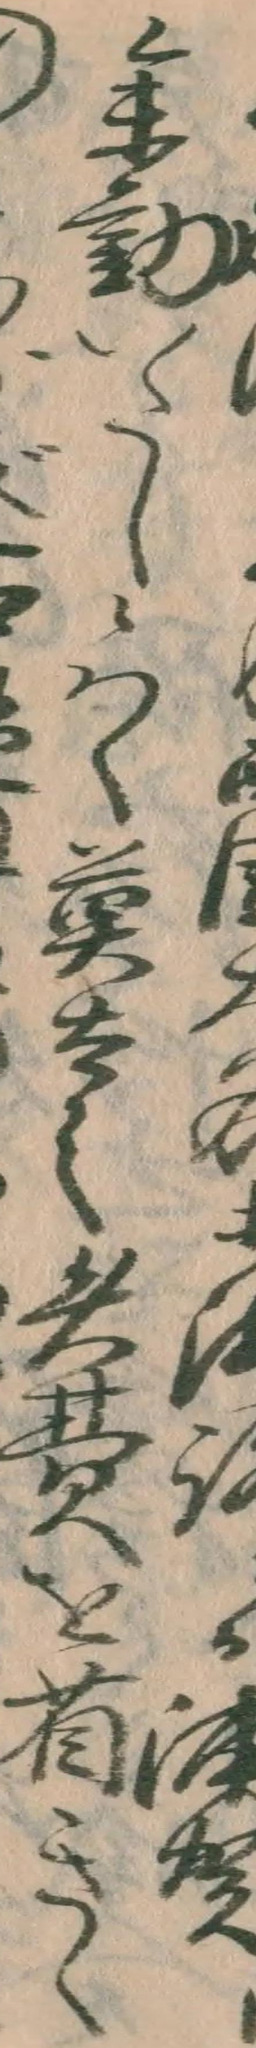参勤いたし候ハヽ莫太之失費を省き候
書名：麗斎叢書. 20
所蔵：国立国会図書館 National Diet Library, JAPAN
